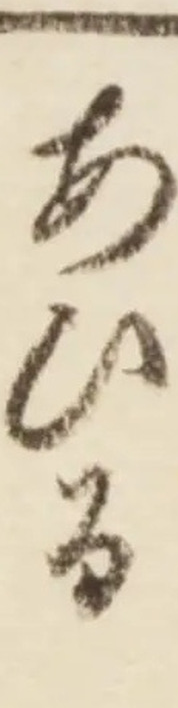あひる

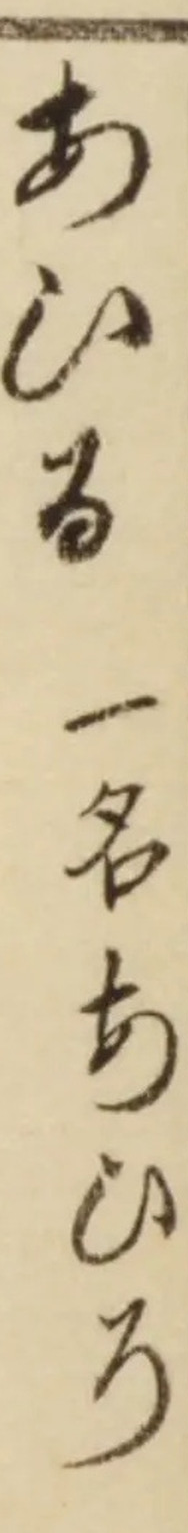あひる一名あひろ
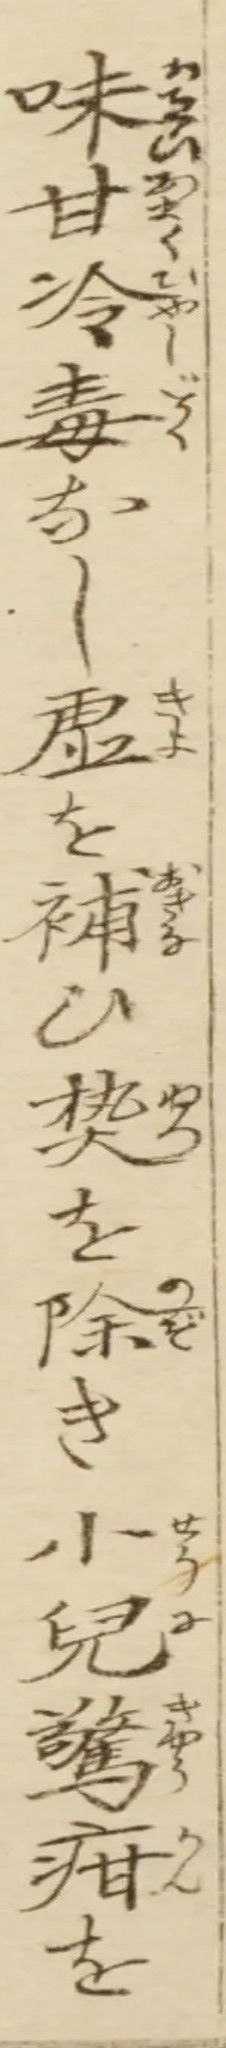味甘冷毒なし虚を補ひ熱を除き小児驚疳を
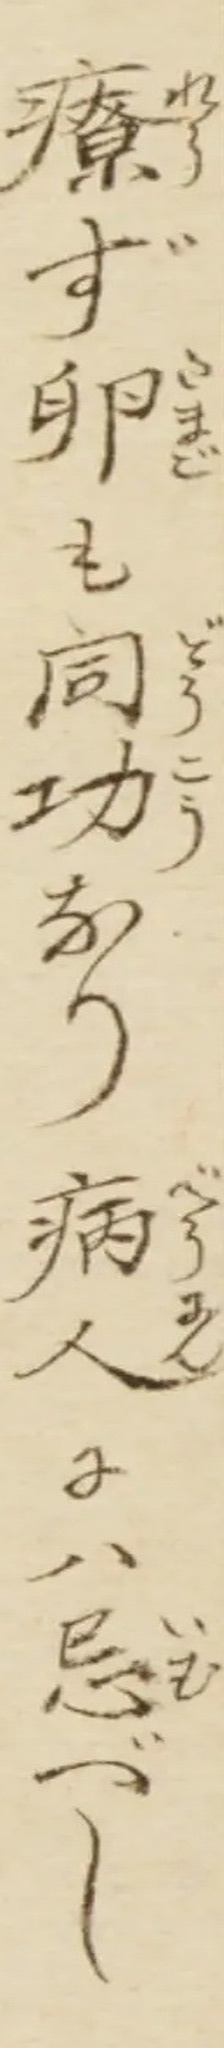療ず卵も同功なり病人には忌べし
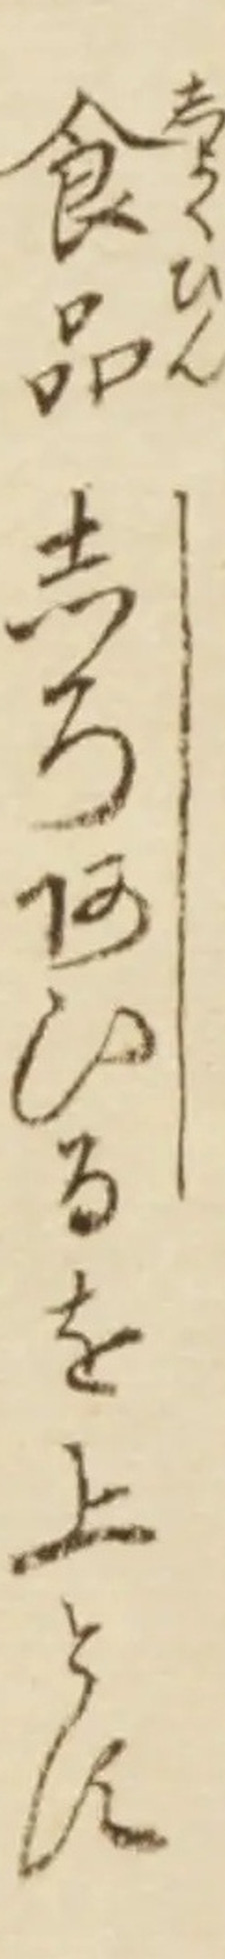食品しろあひるを上とす

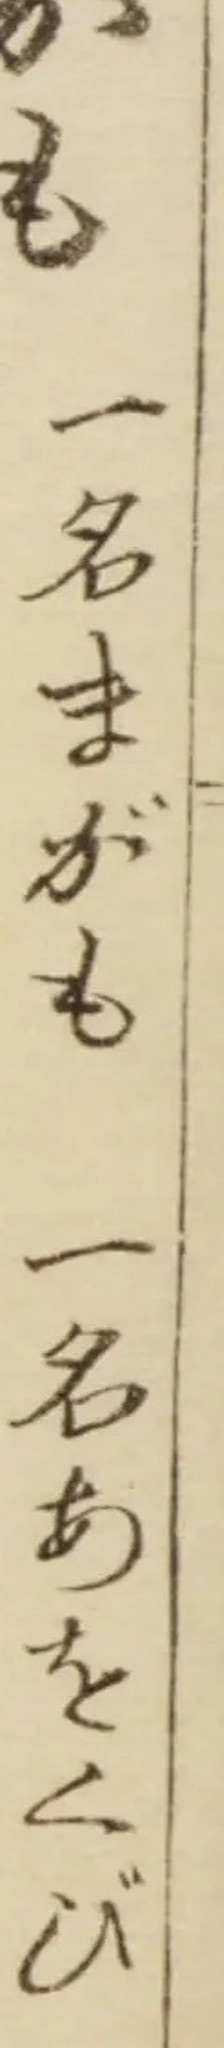かも一名まがも一名あをくび
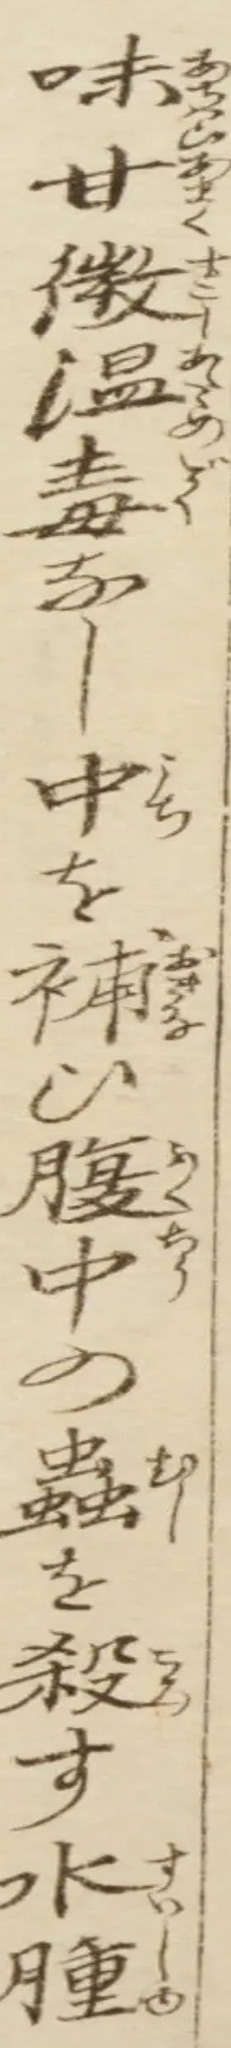味甘微温毒なし中を補ひ腹中の虫を殺す水腫
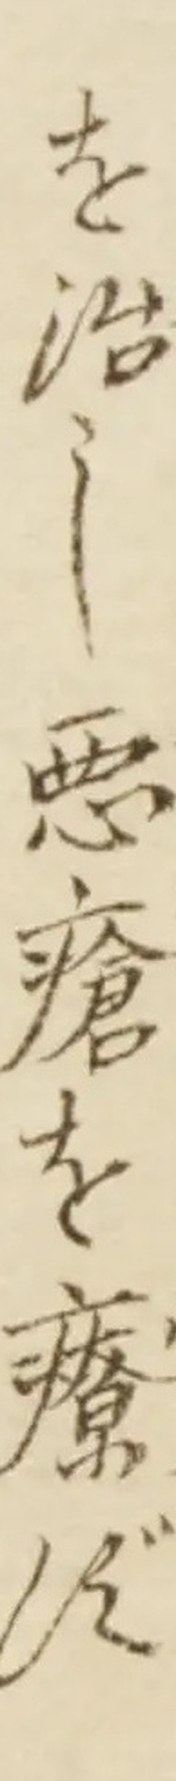を治し悪瘡を療ず
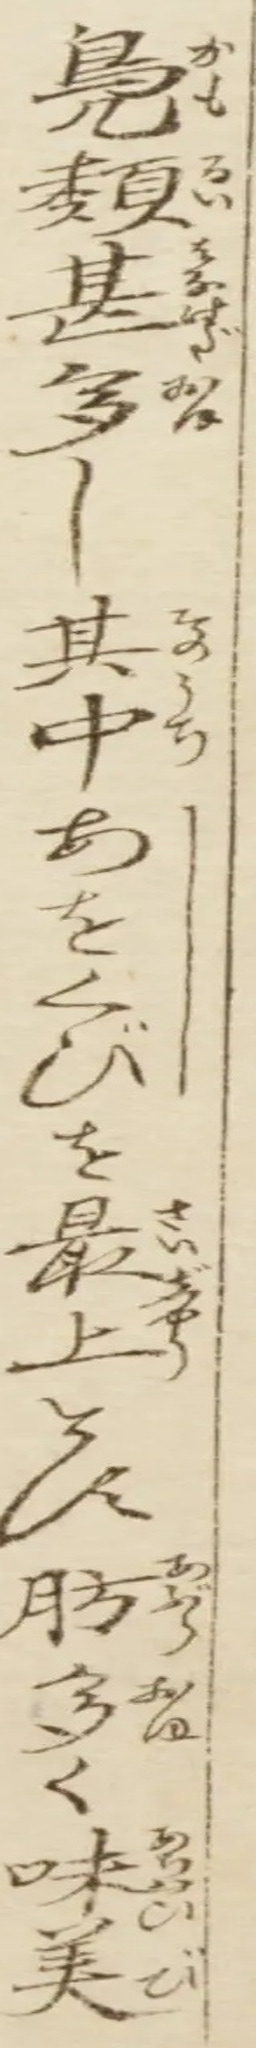鳧類甚多し其中あをくびを最上とす肪多く味美
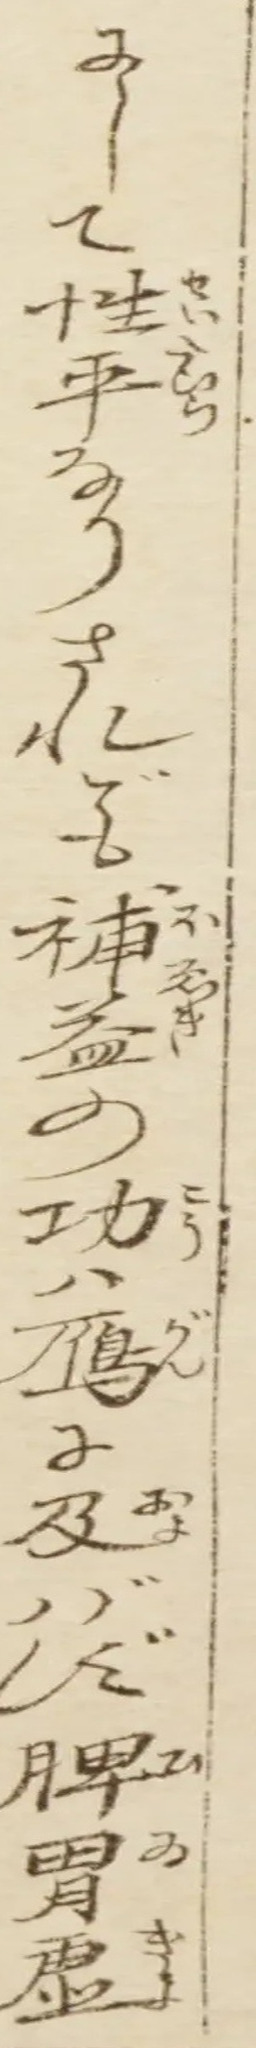にして性平なりされども補益の功は鴈に及ばず脾胃虚
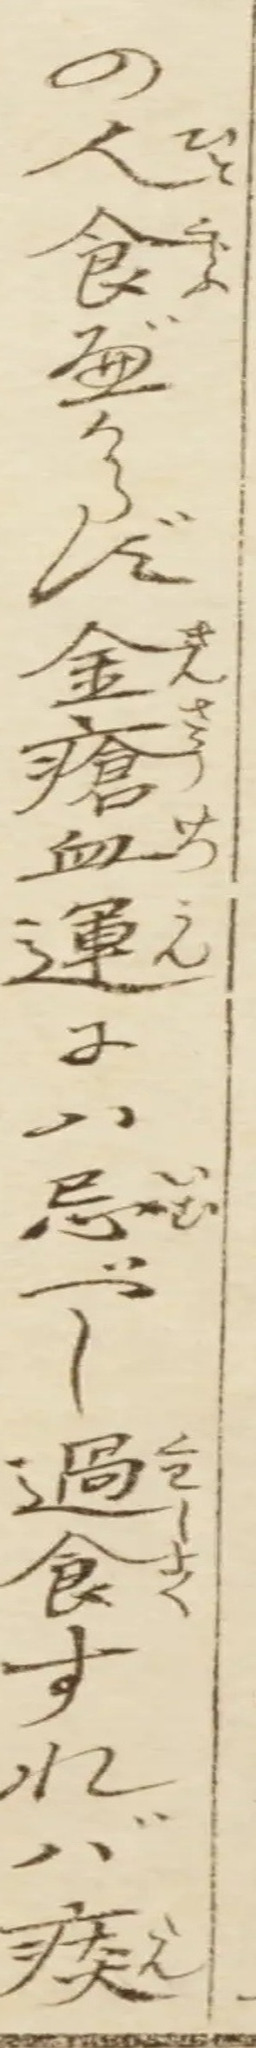の人食べからず金瘡血運には忌べし過食すれば痰
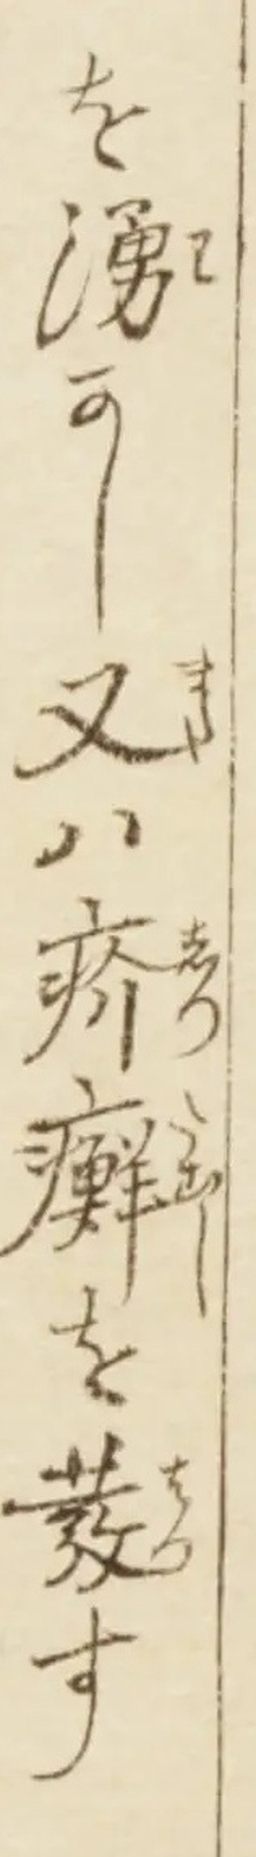を湧かし又は疥癬を発す
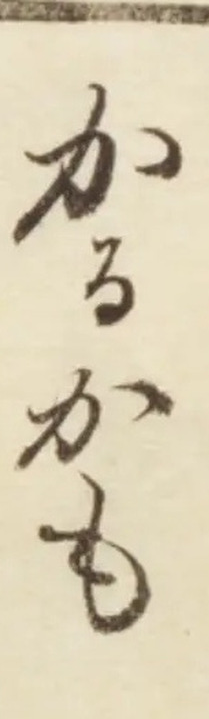かるかも

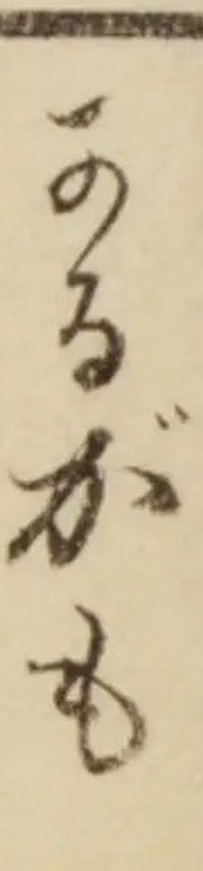かるがも
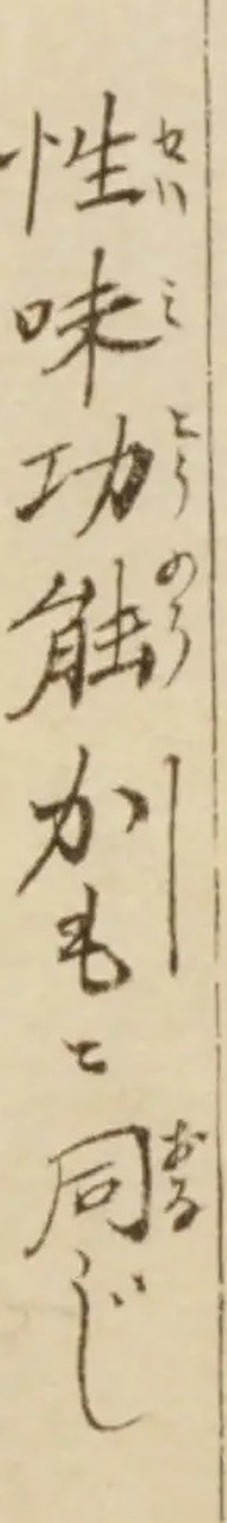性味功能かもに同じ
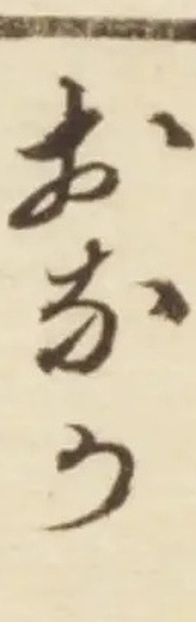おなか
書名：華鳥譜
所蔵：国立国会図書館 National Diet Library, JAPAN
